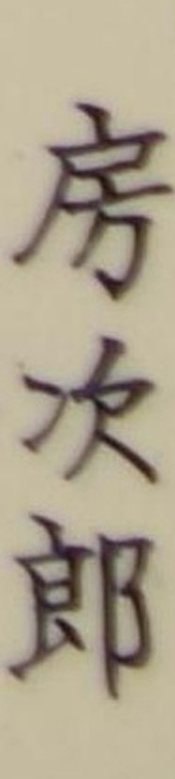房次郎
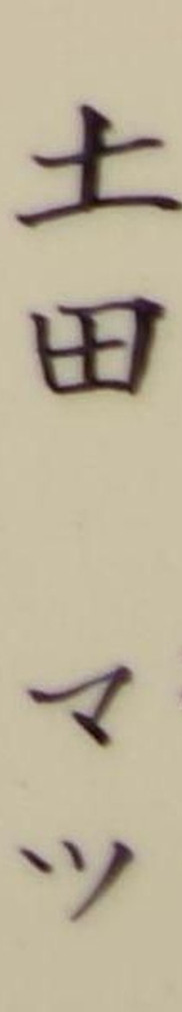土田マツ
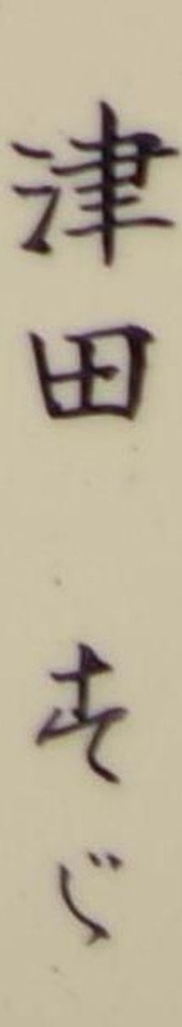津田すゞ
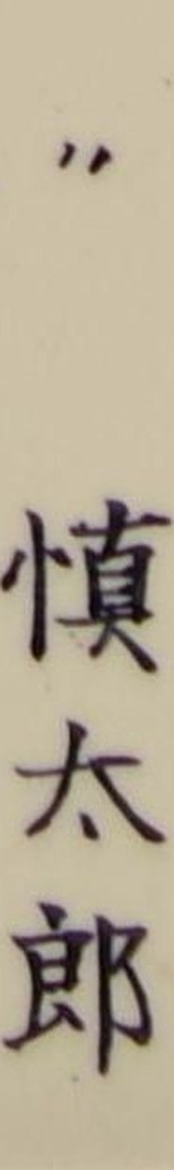慎太郎
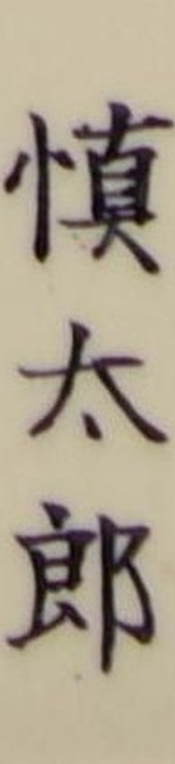慎太郎
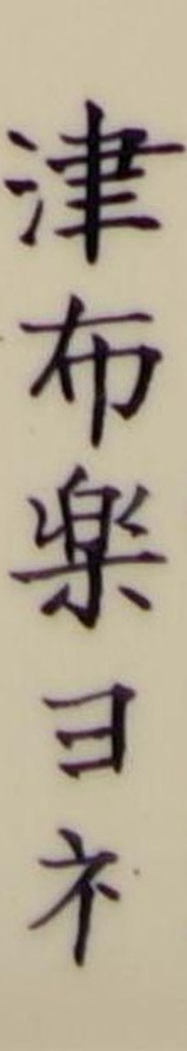津布楽ヨネ
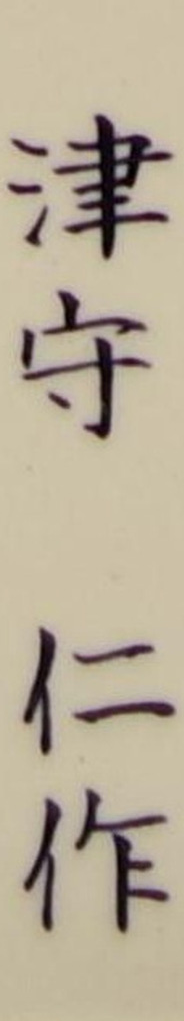津守仁作
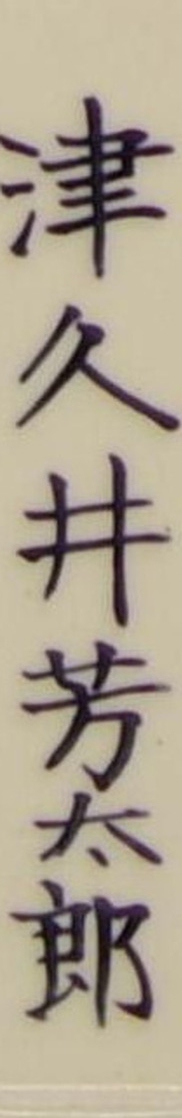津久井芳太郎
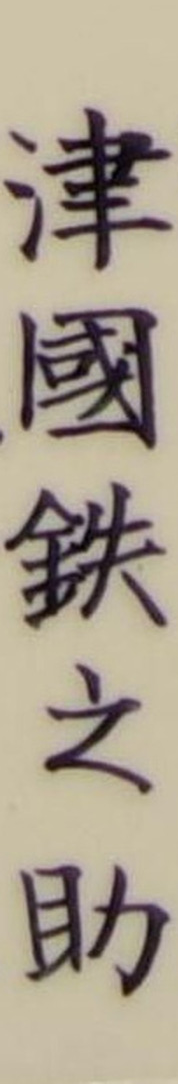津國鉄之助
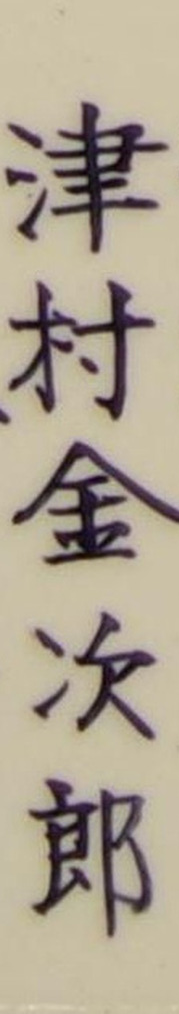津村金次郎
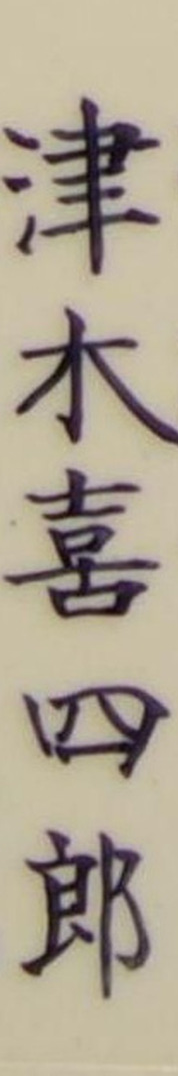津木喜四郎
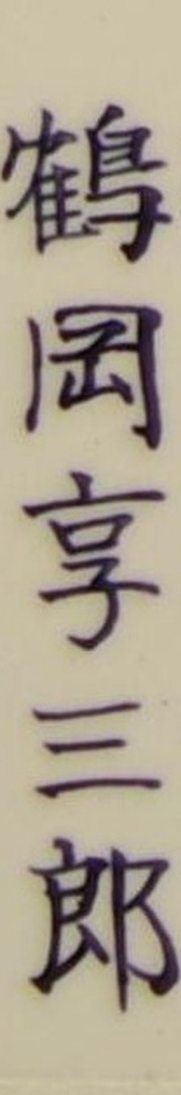鶴岡享三郎
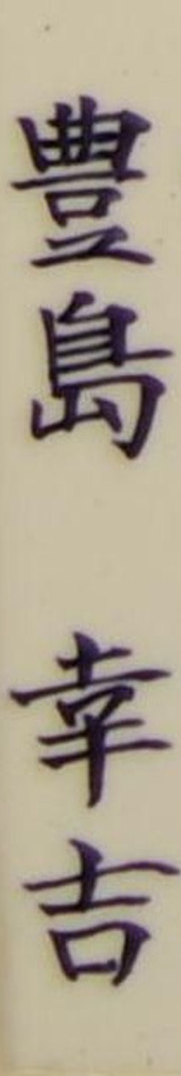豊島幸吉

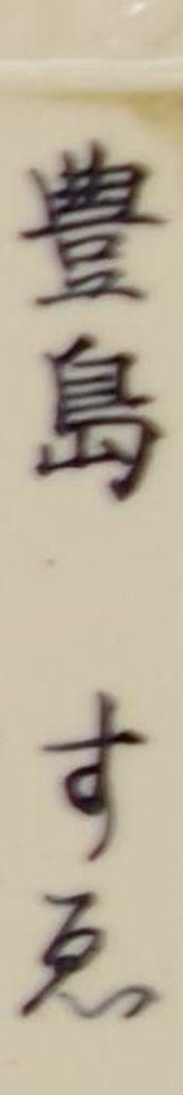豊島すゑ
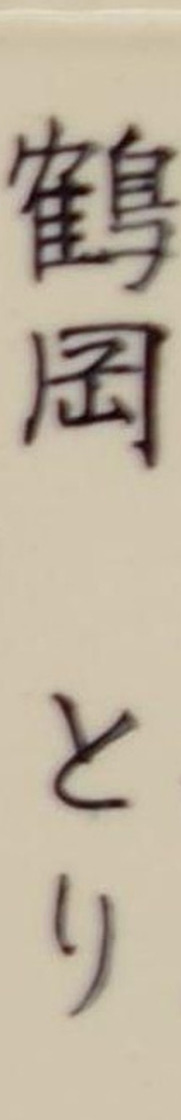鶴岡とり
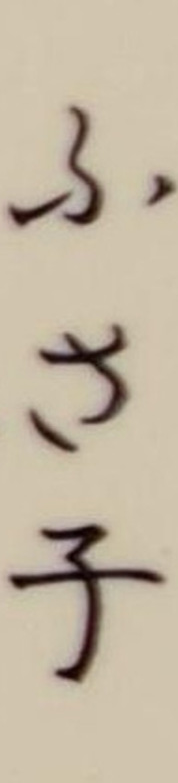ふさ子
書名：E~L
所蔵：高野山金剛峯寺
